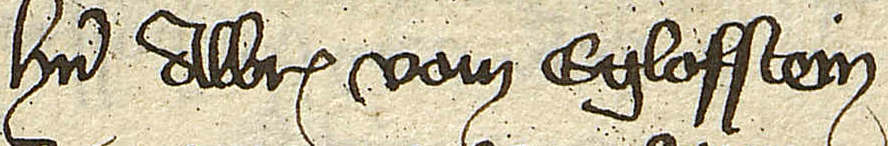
hn* Albr* vom Eglofſtein
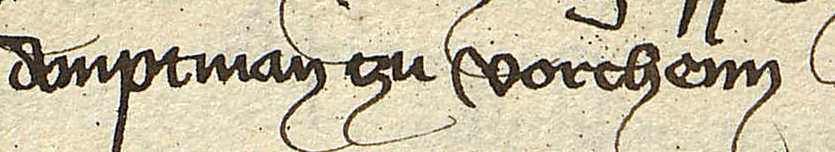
Amptman cʒu vorcheim
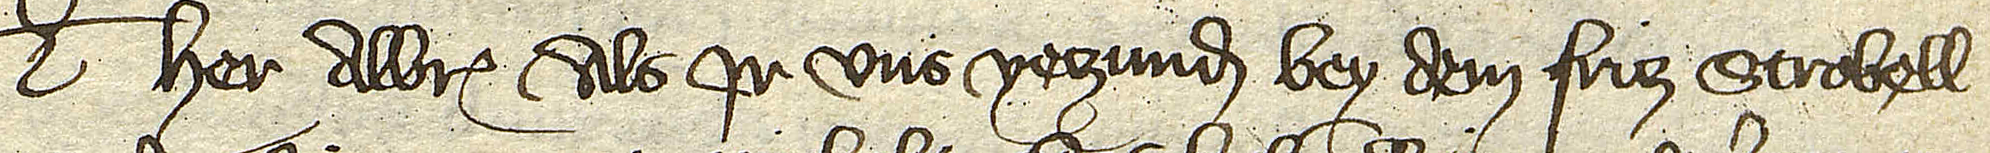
L* her Albr* / Als Ir vns yecʒund* bey dem fricʒ Strobell
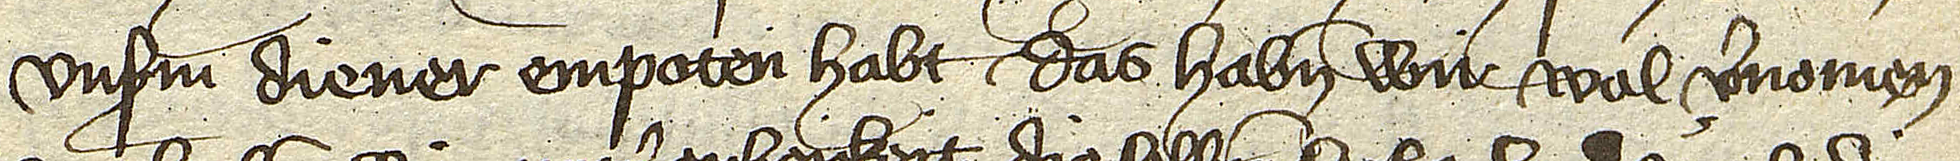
vnſ*m diener empoten habt / das habn* wir wol v*nomen
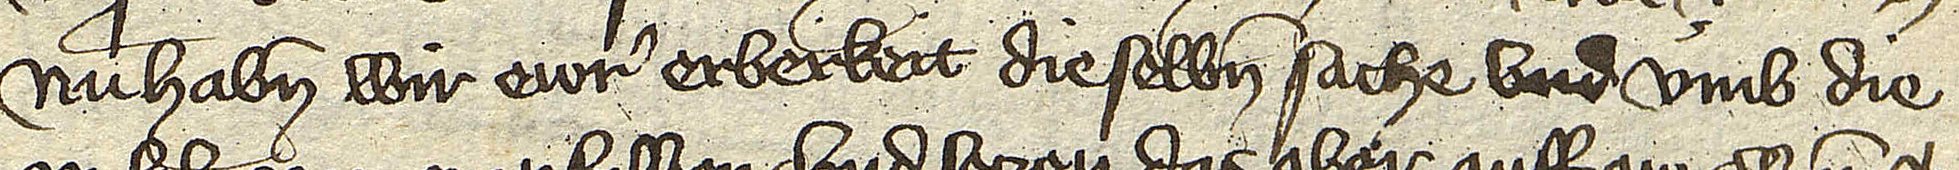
Nu habn* wir ewr* erberkeit dieſelbn* ſache vnd v̈mb die
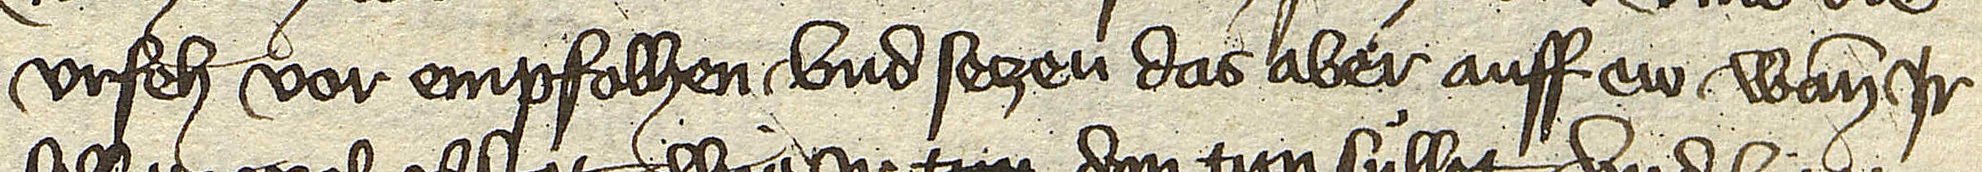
vrfeh vor empfolhen / vnd ſecʒen das aber auff ew / wan* Ir
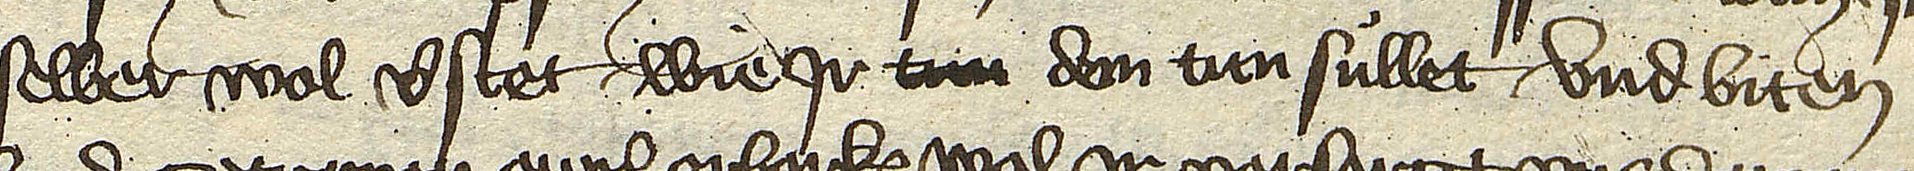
ſelber wol v*ſtet / wie Ir tun dem tun ſüllet / vnd biten
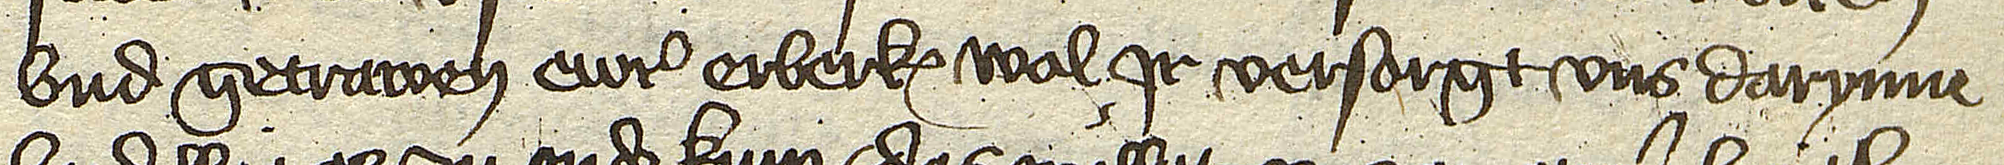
vnd getrawen ewr* erberk* wol Ir verſorgt vns darynne
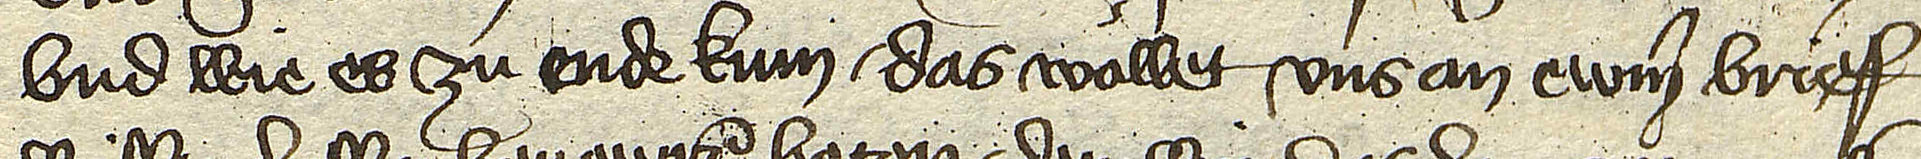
vnd wie es cʒu ende kum / das wöllet vns an ewm* brief
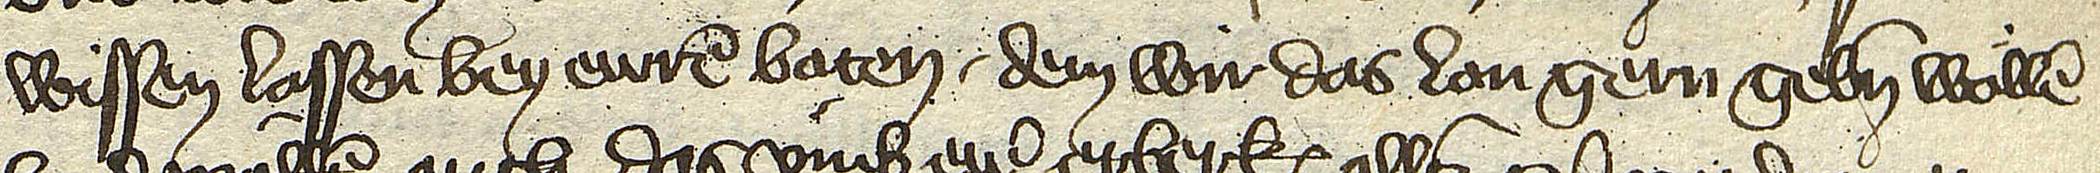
wiſſen laſſen bey ewre* boten / dem wir das lon gern gebn* wölle*
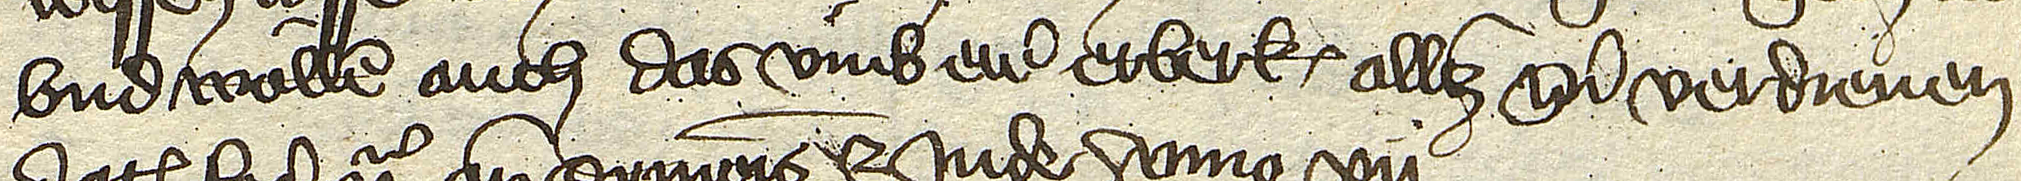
vnd wölle* auch das v̈mb ew* erberk* / allcʒ* gn* verdienen
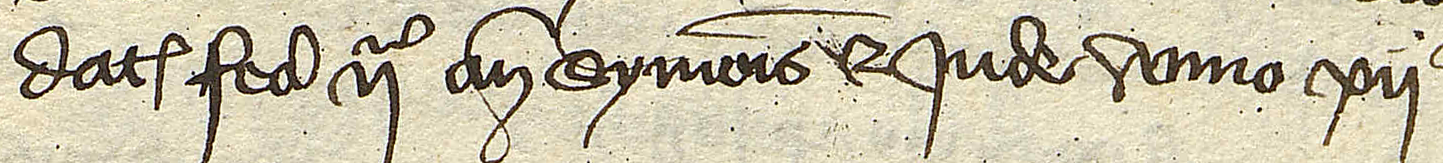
dat* fea* ii* an* Symois* @ Iude Anno xii
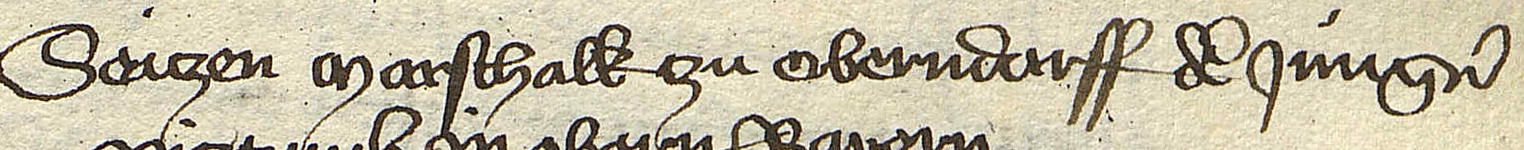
Seicʒen Marſchakl cʒu Oberndorff d* Iüngn*
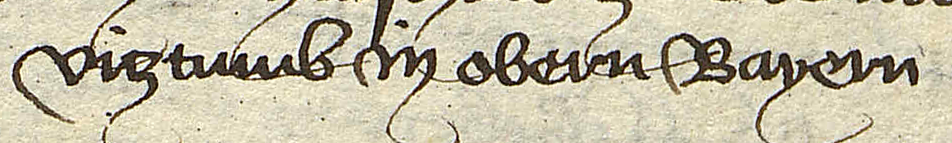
vicʒtumb in obern Bayern
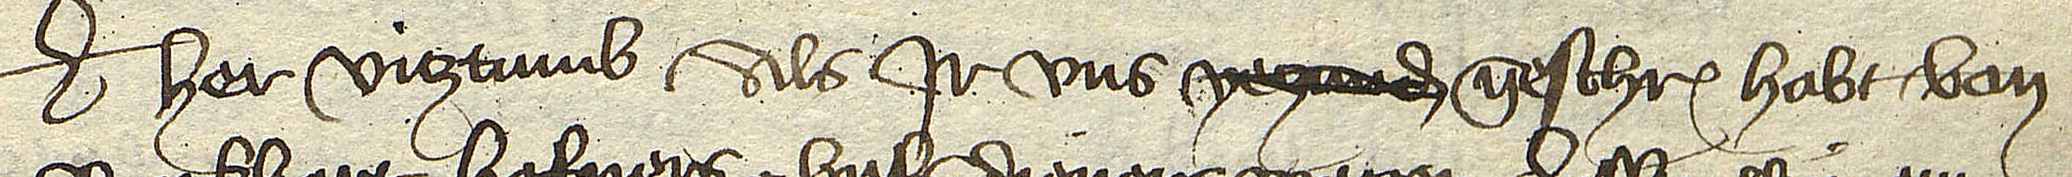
L* her vicʒtumb / Als Ir vns yecʒund* geſchr* habt / von
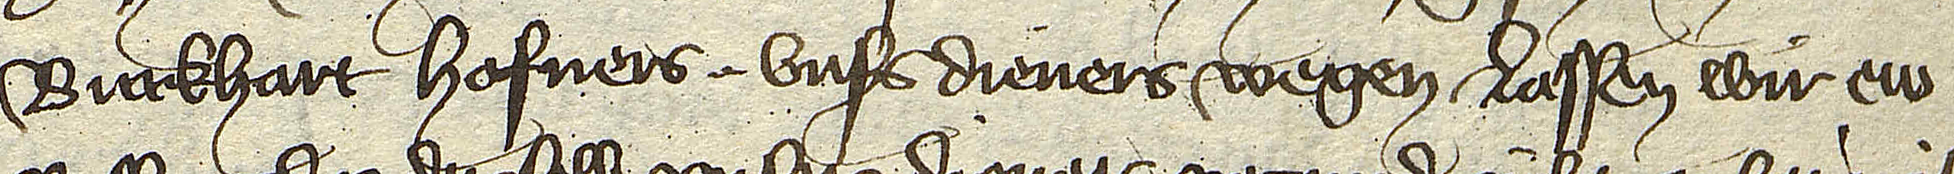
Burkhart hofners ~ vnſ*s dieners wegen / laſſen wir ew
